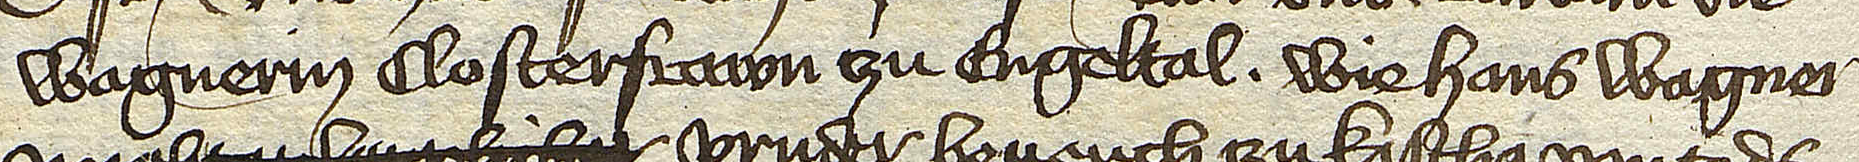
Wagnerin Cloſterfrawn cʒu Engeltal . wie hans Wagner
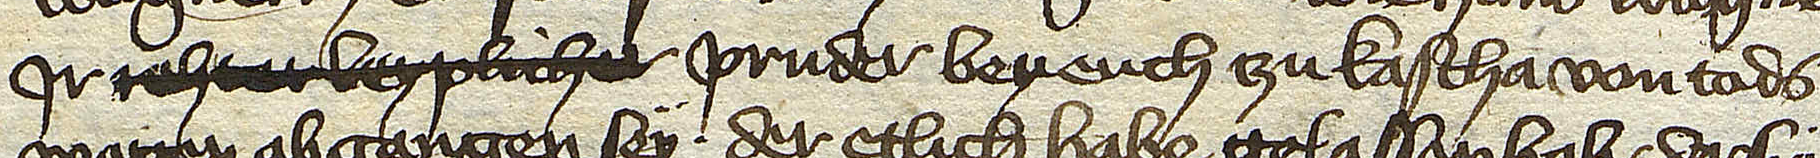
Ir rehter leyplicher pruder bey euch cʒu kaſcha von tods
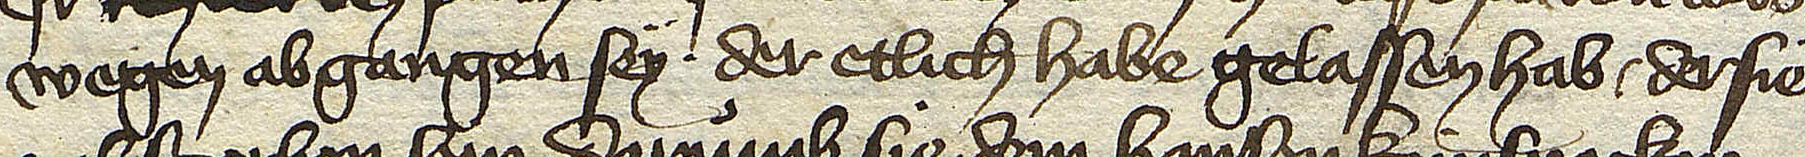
wegen abgangen ſey . der etlich habe gelaſſen hab / der ſie
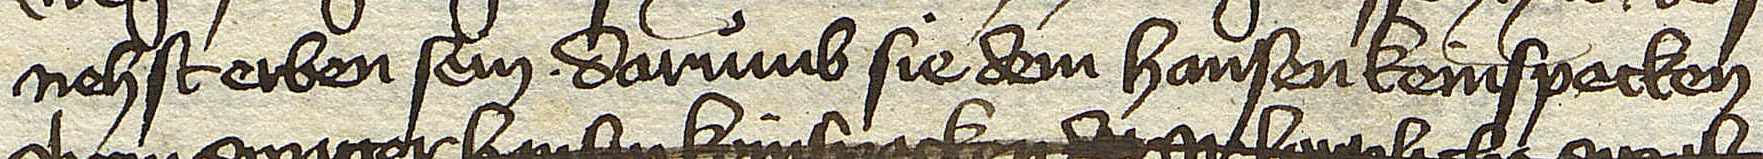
nehſt erben ſein . darümb ſie dem hanſen keinſpecken
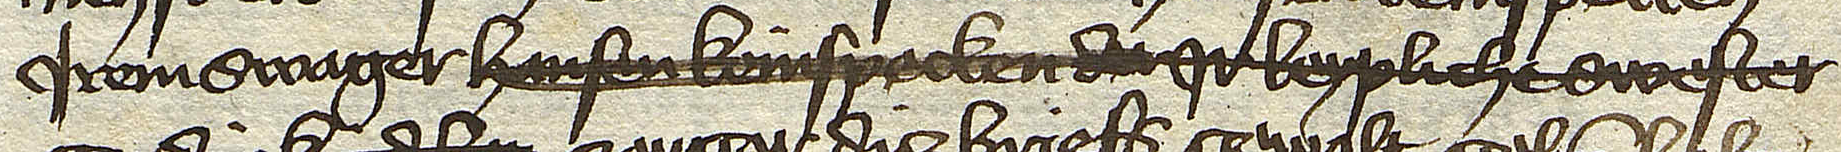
Irem Swager hanſen keinſpecken der Ir leypliche Sweſter
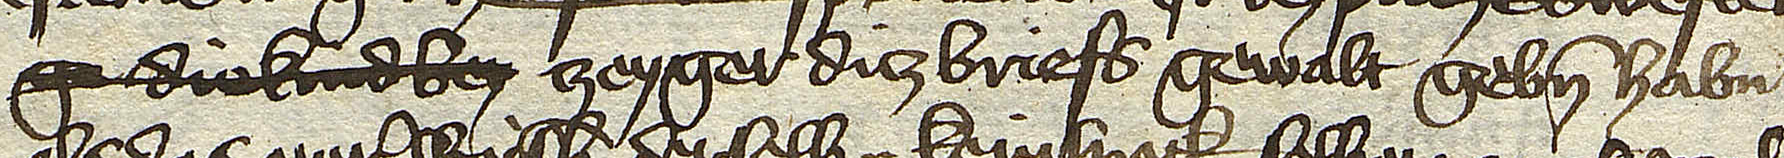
ge die kind bey cʒeyger dicʒ briefs gewalt geb*n hab*n
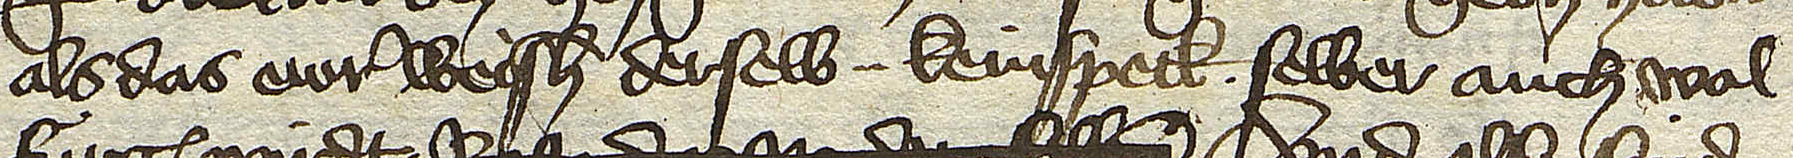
als das ew*r weiſh* derſelb ~ keinſpeck . ſelber auch wol
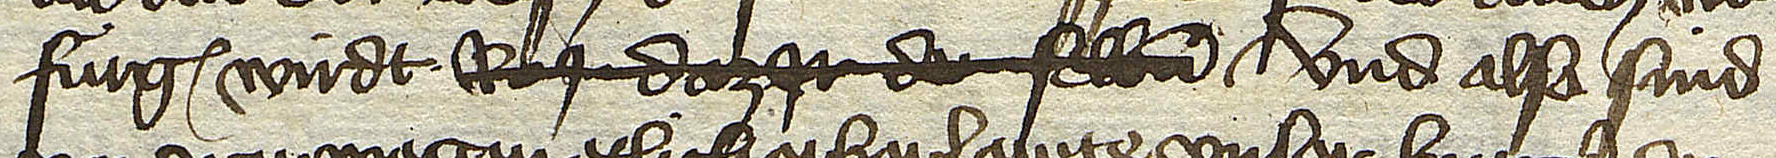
fürg* wirdt . Ro* . daʒ Ir demſelb*n / Vnd alſo ſind
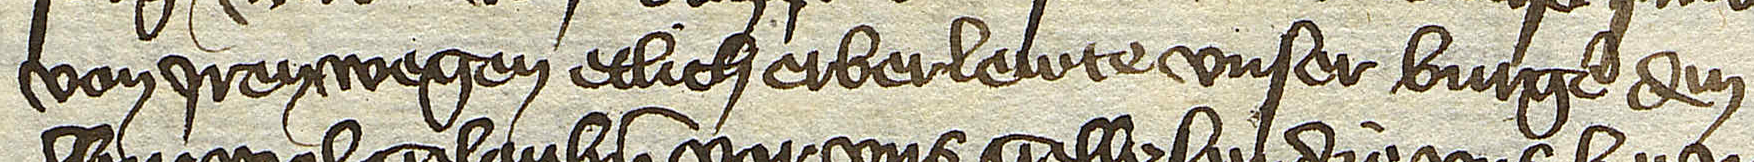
von Iren wegen etlich erber lewte vnſer burge* den
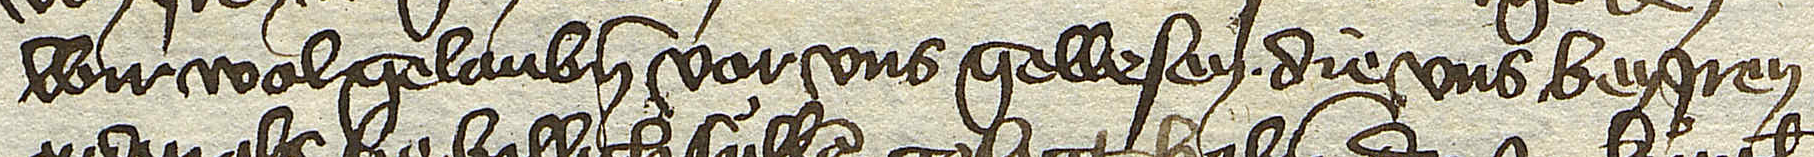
wir wol gelaub*n vor vns geweſen . die vns bey Iren
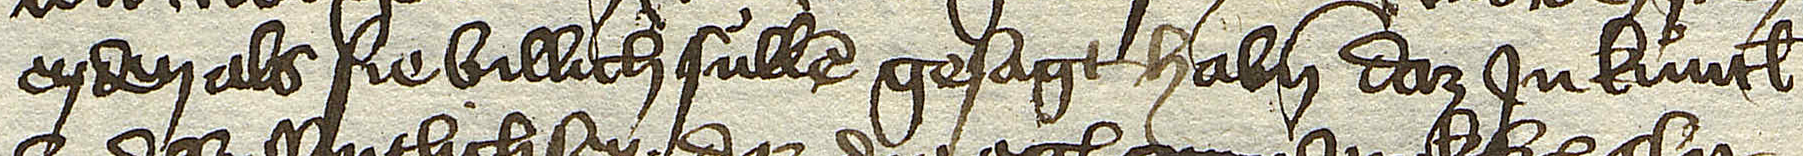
eyden als ſie billich ſülle* geſagt hab*n daʒ In küntl*
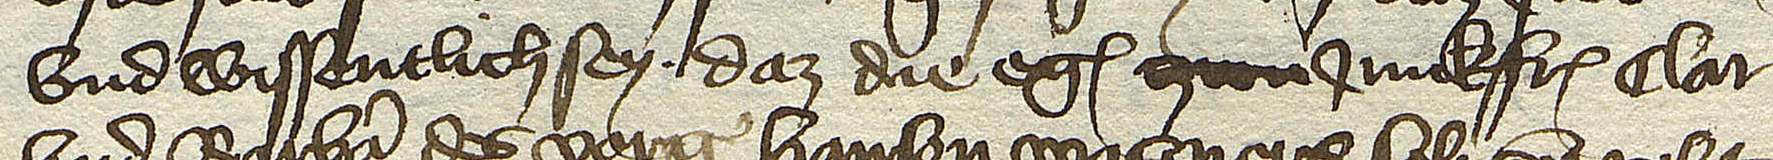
vnd wiſſentlich ſey . daʒ die eg* cʒwn Iunkfr* Clar
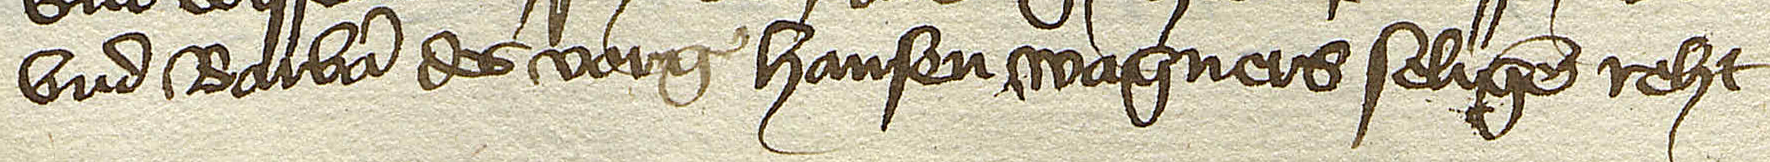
vnd Barba* des vorg* hanſen wagners ſelige* reht
